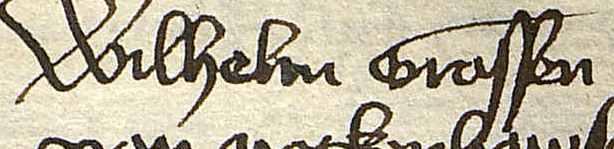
Wilhelm Groſſen
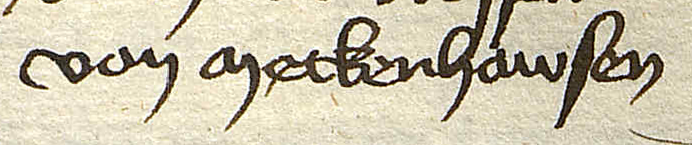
von Meckenhawſen
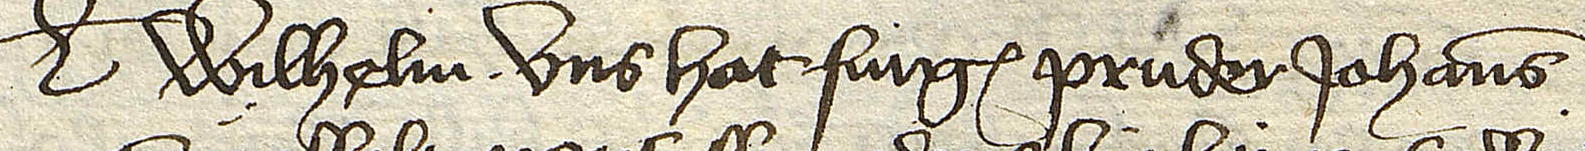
L* Wilhelm . Vns hat furg* pruder Iohans*
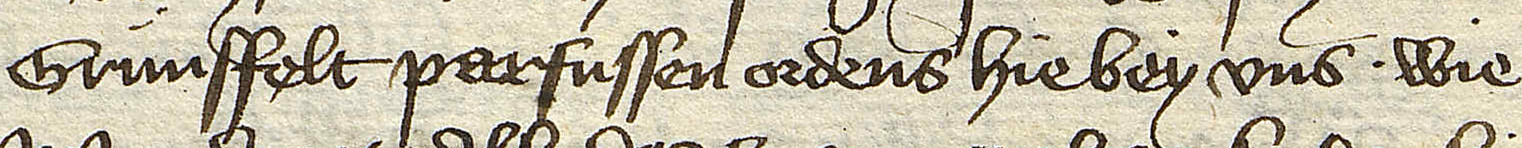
Grünſfelt parfuſſen ordens hie bey vns . wie
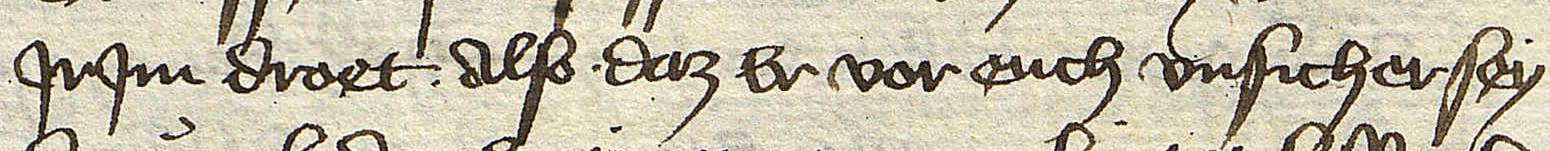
Ir Im droet . Alſo . daʒ er vor euch vnſicher ſey
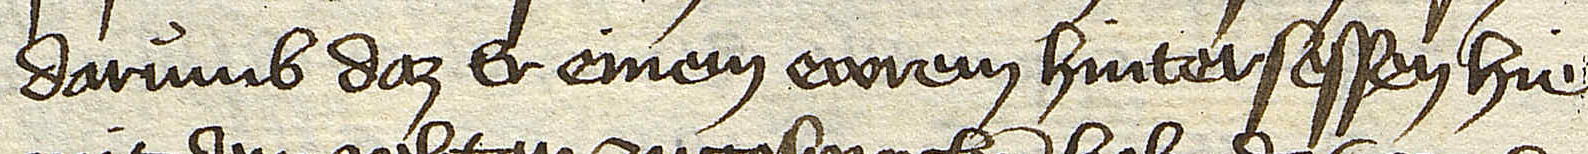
darümb daʒ er einem ewrem hinterſeſſen hie
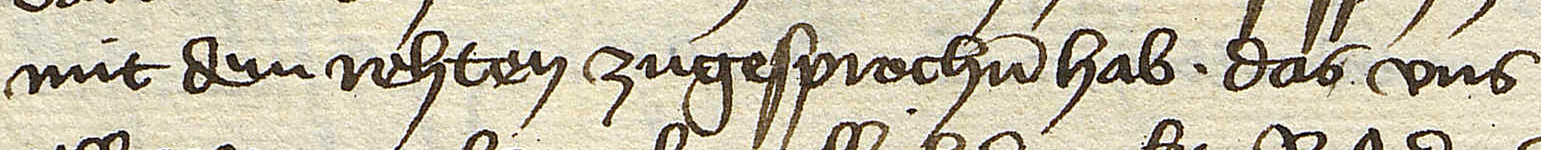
mit dem rehten cʒugeſproch*n hab . das vns
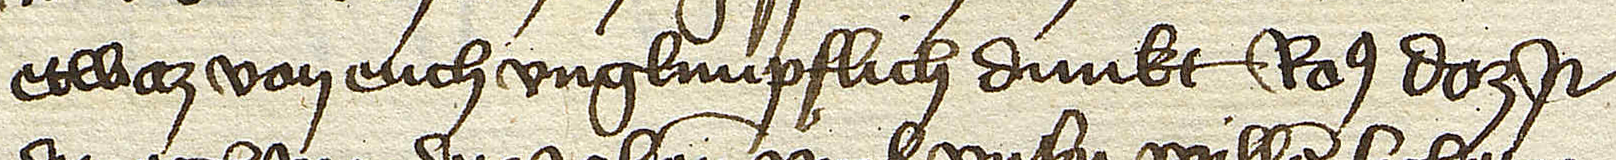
etwaʒ von euch vnglimpflich dunkt Ro* daʒ Ir
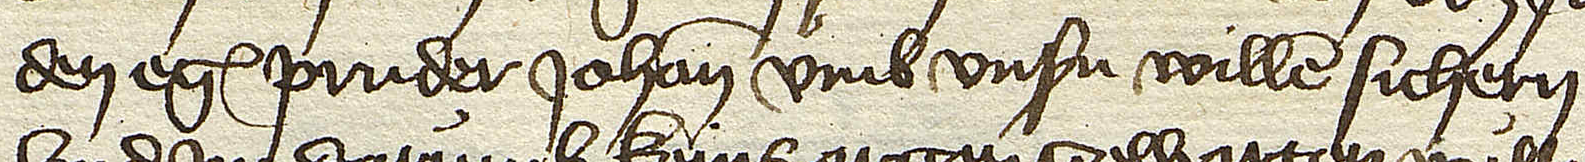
den eg* pruder Iohan* v̈mb vnſ*n wille* ſichern
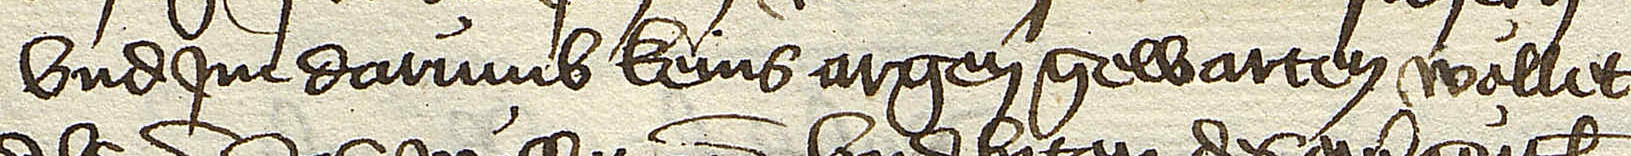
vnd Im darümb keins argen gewarten wöllet
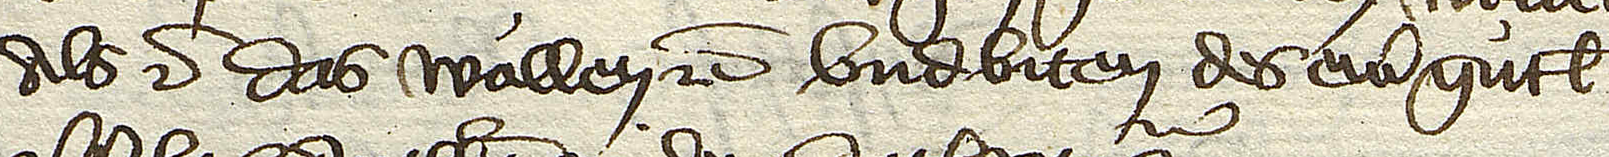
Als ec* das wöllen ec* vnd biten des ew* gütl*
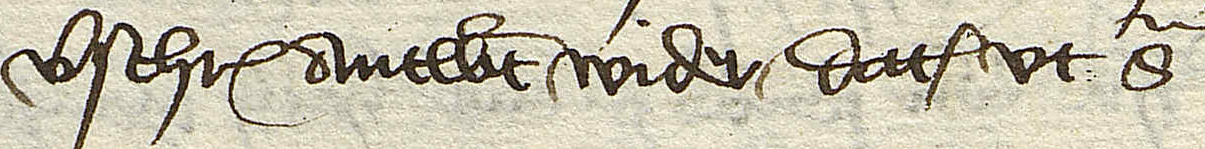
v*ſchr* Antw*t wider / dat* vt s*
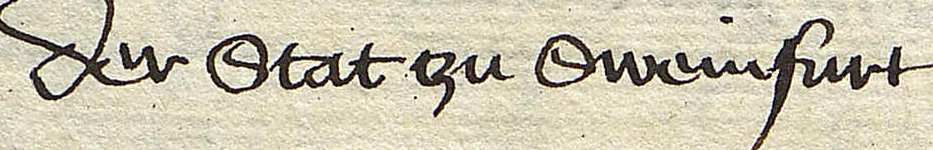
Der Stat cʒu Sweinfurt
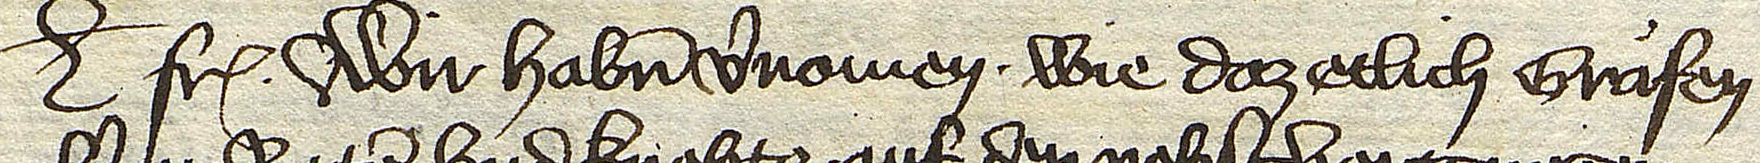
L* fr* . Wir hab*n v*nomen . wie daʒ etlich Gräfen
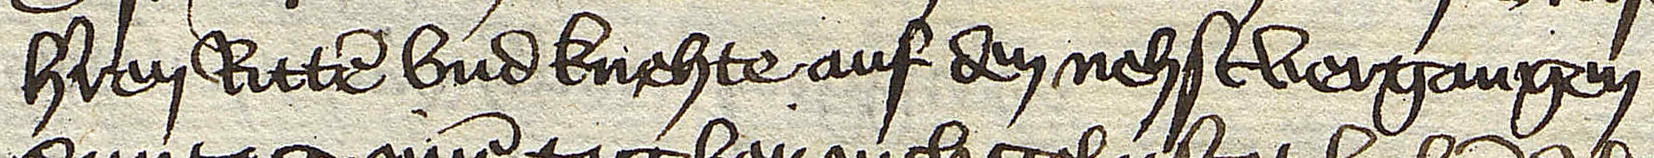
h*ren Ritte* vnd knehte auf den nehſtvergangen
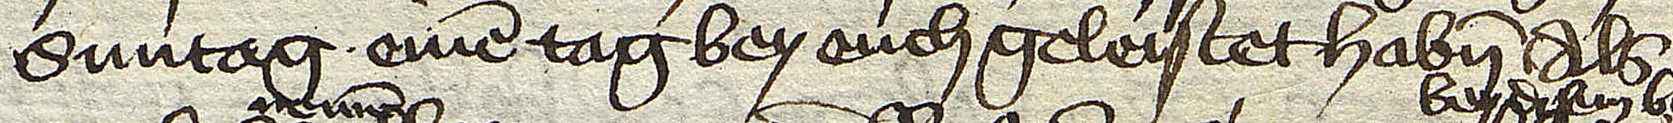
Suntag . eine* tag bey euch geleiſtet hab*n / Als
